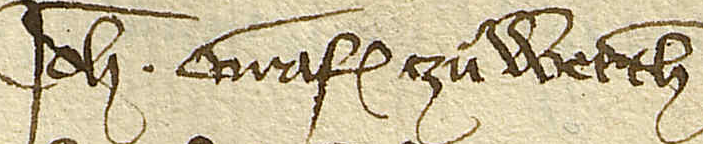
Ioh* . Graf* cʒü Werth*
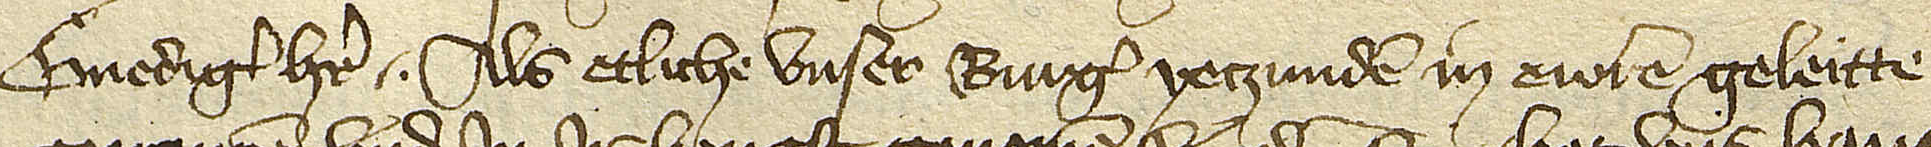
Gnedig* hr* / . Als etliche vnſer Burg* yecʒund* in ewre* geleitte
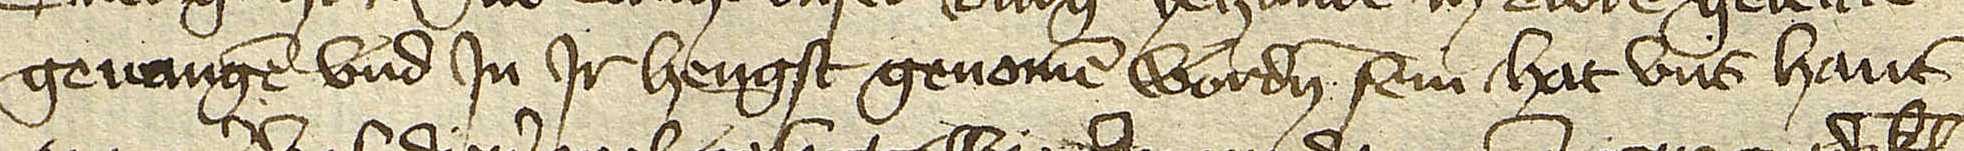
geuange* vnd In Ir hengſt genome* wordn* ſein / hat vns hans
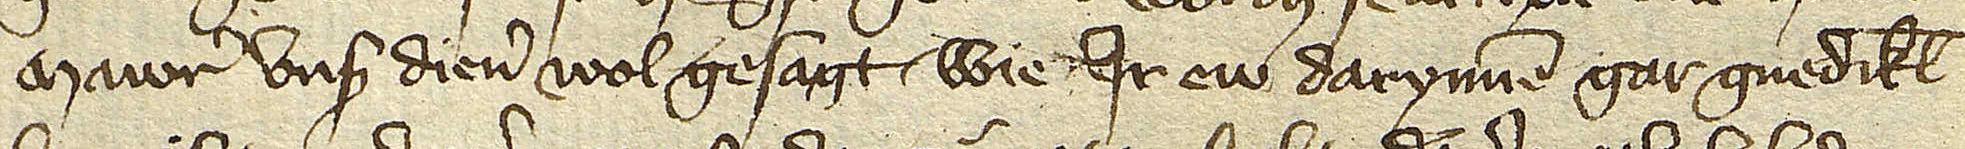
Mawr* vnſ* dien* wol geſagt / wie Ir ew darynne* gar gnedikl*
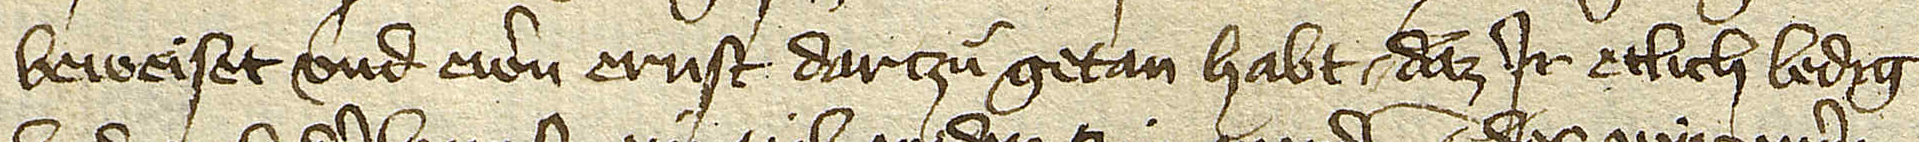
beweiſet vnd ew*n ernſt darcʒü getan habt / daʒ Ir etlich ledig
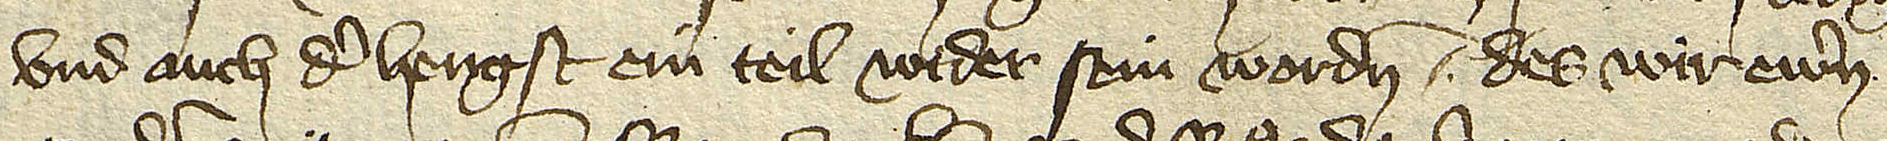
vnd auch d* hengſt ein teil wider ſein wordn* / . des wir ew*n
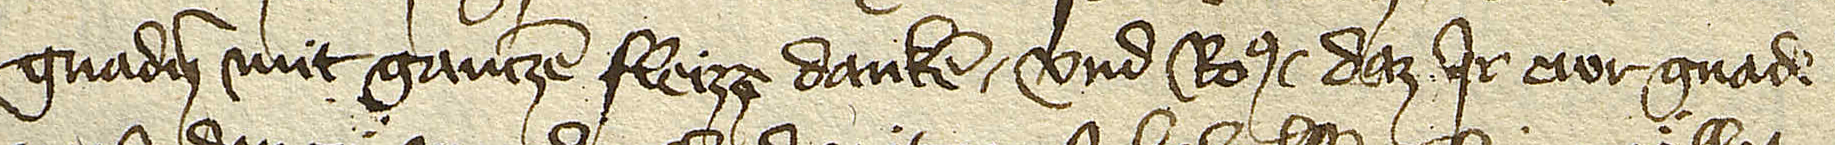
gnadn* mit gancʒe* fleiʒʒe danke* / vnd Ro* / daʒ Ir ewr gnade
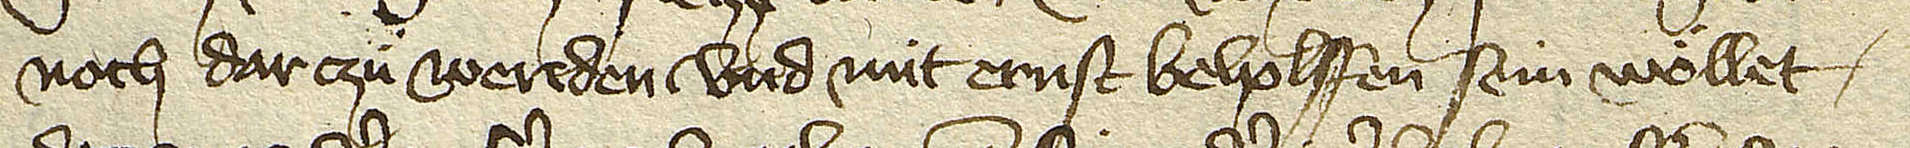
noch dar cʒü wenden / vnd mit ernſt beholffen ſein wöllet /
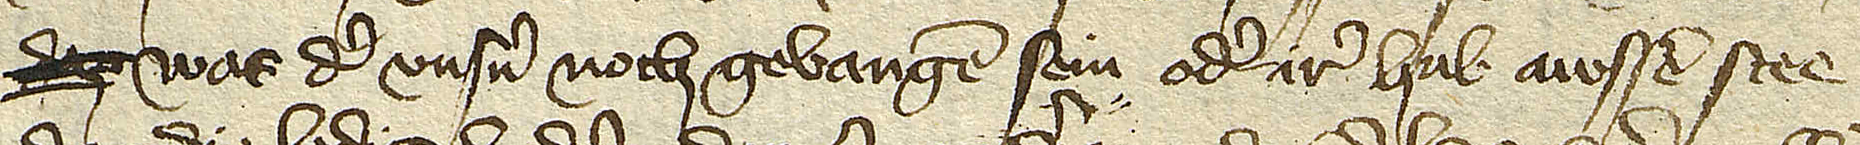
daʒ was d* vnſn* noch gevange* ſein od* ir* hab awſſe* ſtee
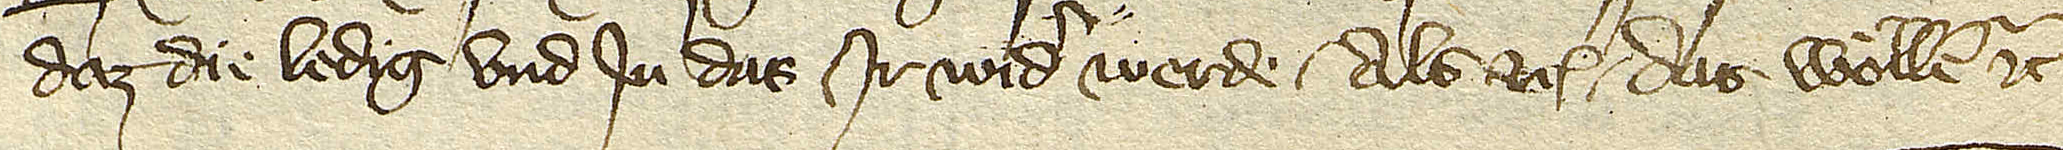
daʒ die ledig vnd In das Ir wid* werde / Als ec* / Das wölle* ec*
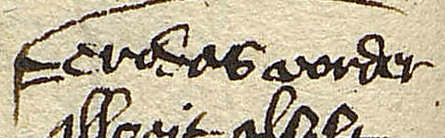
%%% das vorder
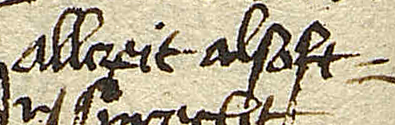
allcʒeit alſoft
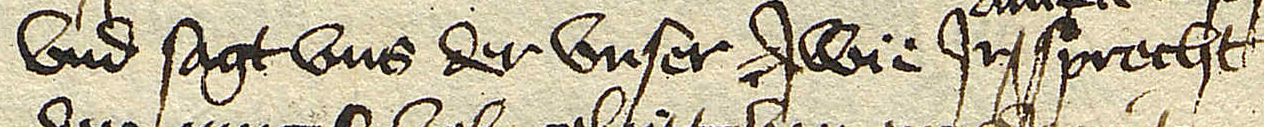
vnd ſagt vns der vnſer I wie Ir ſprecht
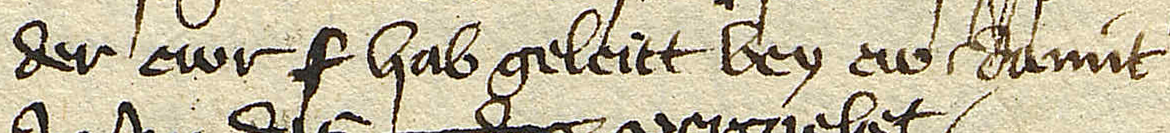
der ewr f hab geleit bey ew / damit
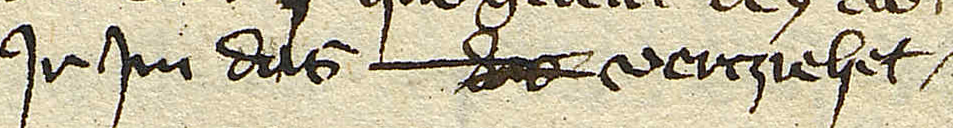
Ir Im das das vercʒiehet /
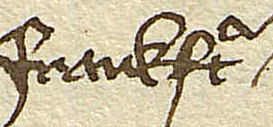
Frankft*/
